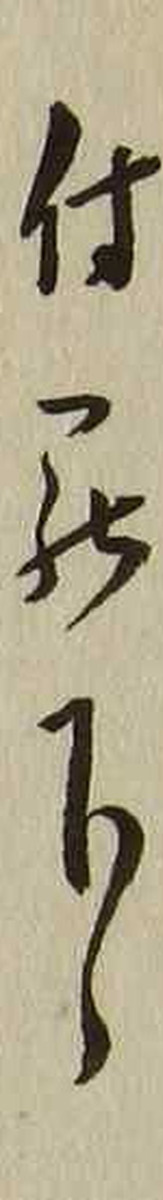付罷下候
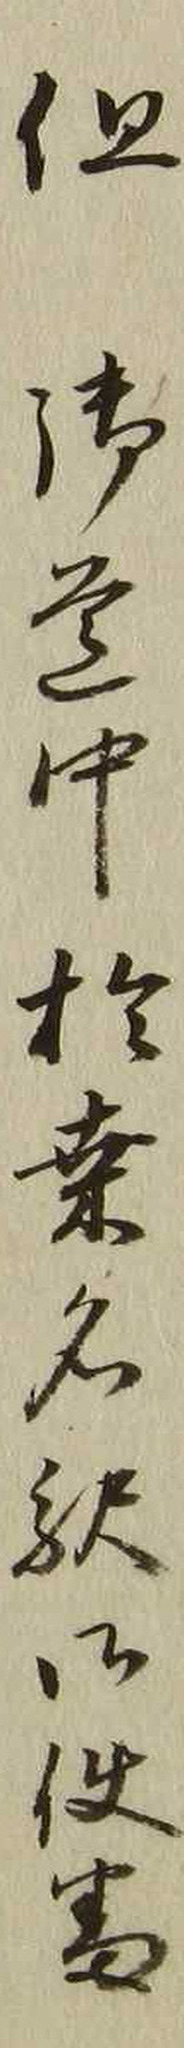但御道中於桑名駅御使番
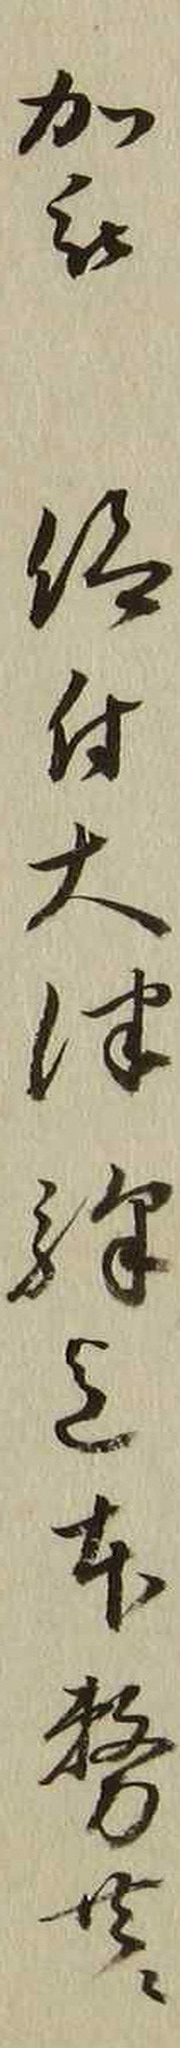加被仰付大津駅迄本務共ニ
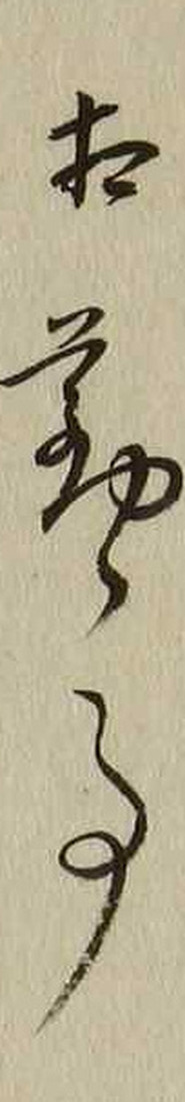相勤候事
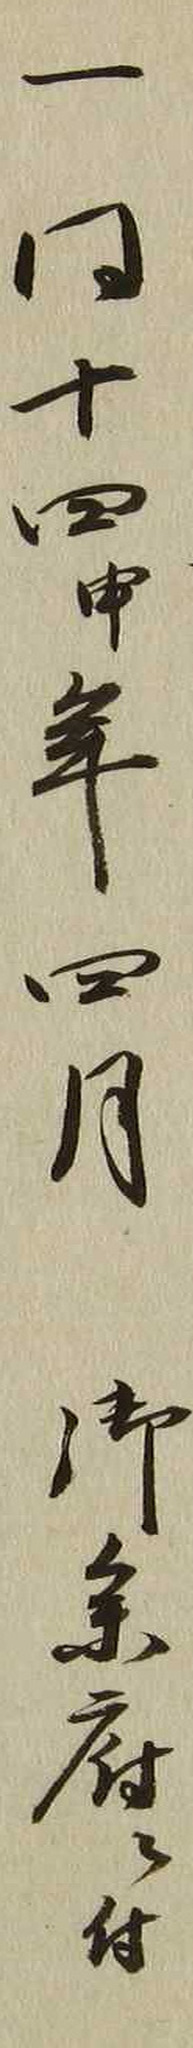一同十四申年四月御参府ニ付
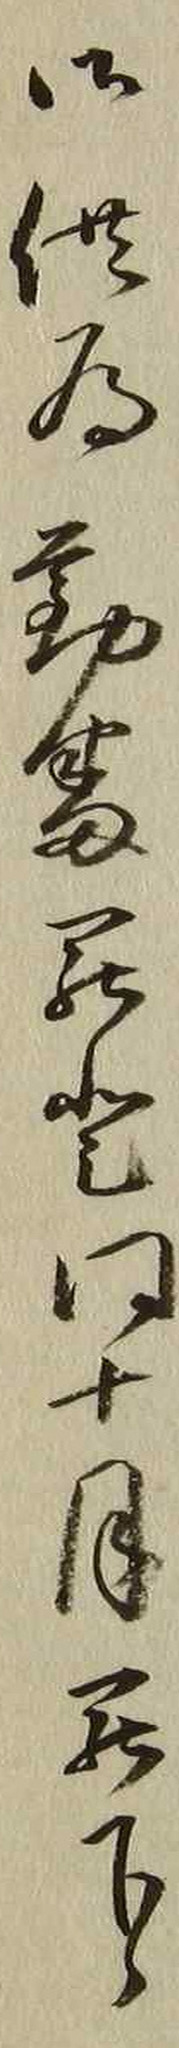御供為勤番罷登同十月罷下候
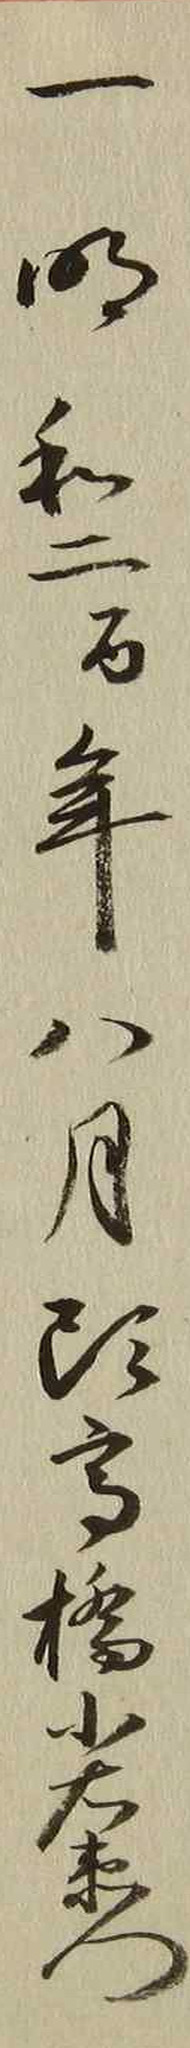一明和二酉年八月頭高橋小右衛門
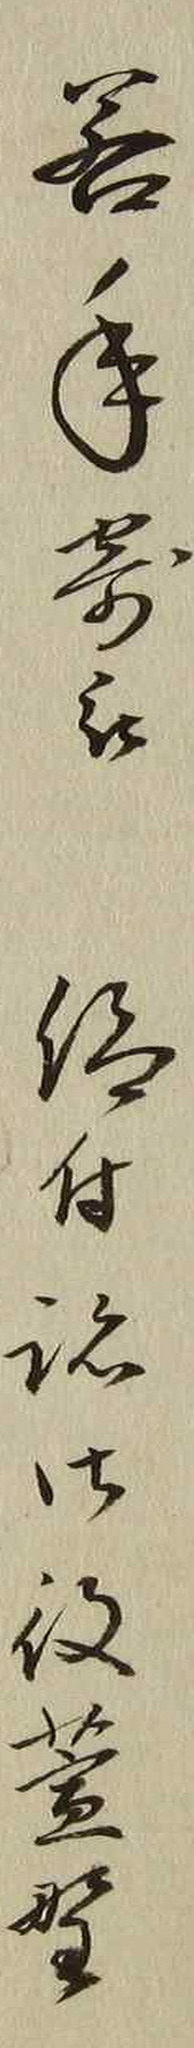若年寄被仰付跡御役萱野
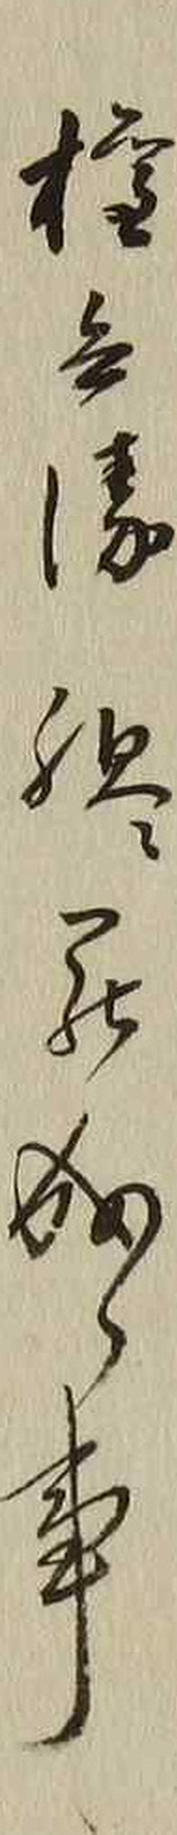権兵衛組ニ罷成候事
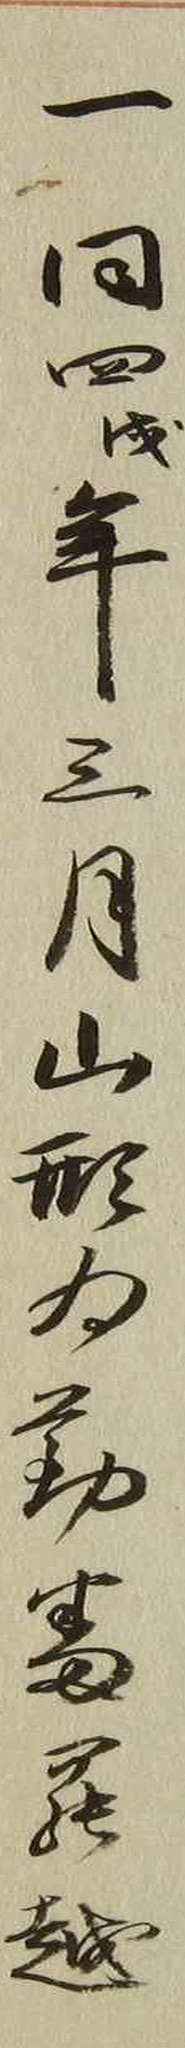一同四戌年三月山形為勤番罷越
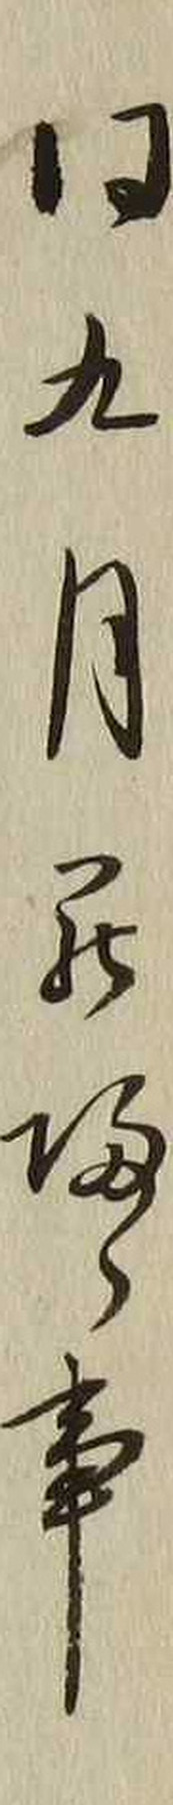同九月罷帰候事
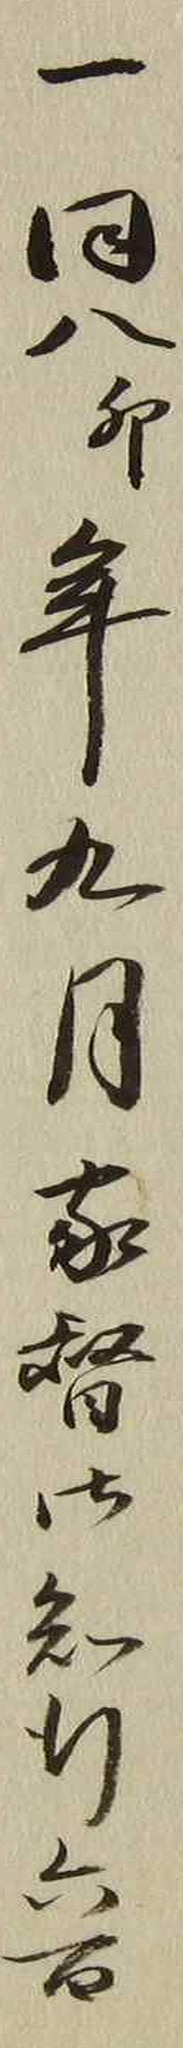一同八卯年九月家督御知行六百
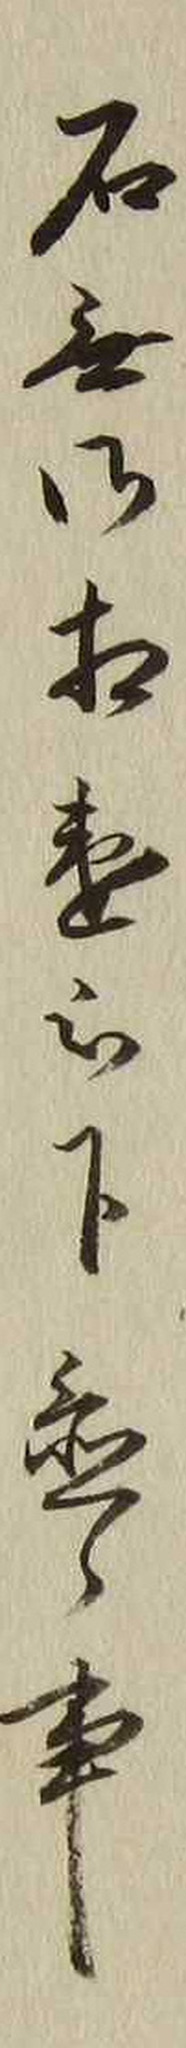石無御相違被下置候事
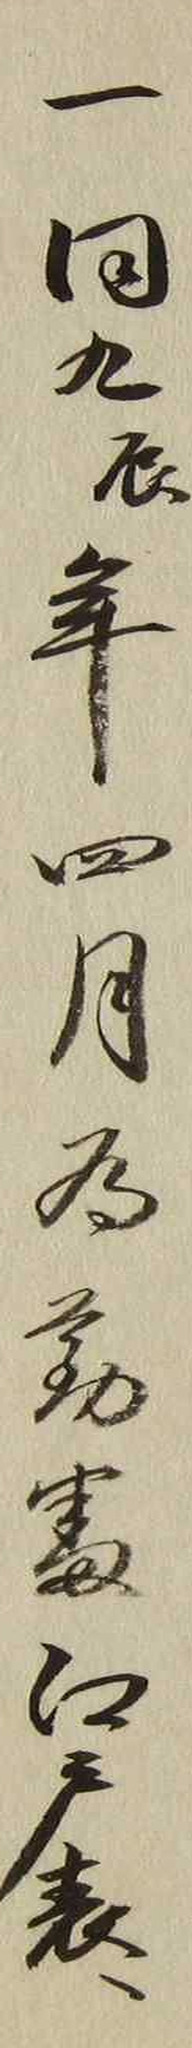一同九辰年四月為勤番江戸表へ
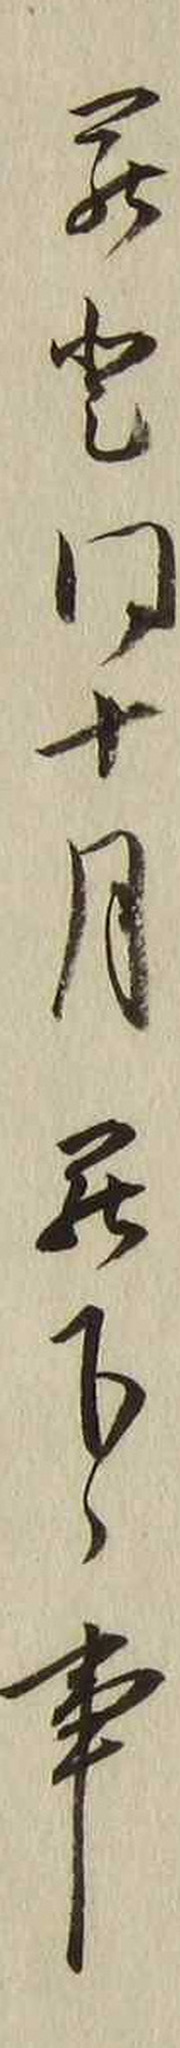罷登同十月罷下候事
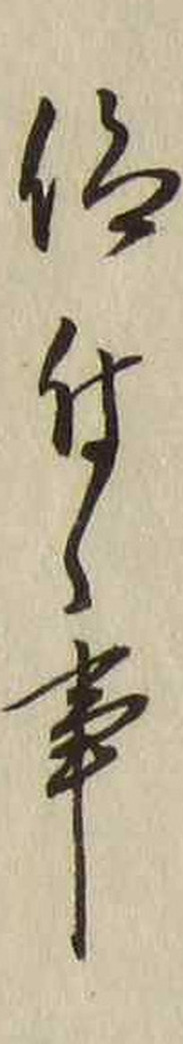仰付候事
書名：諸士系譜　巻之69　を之部3
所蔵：会津若松市立会津図書館
